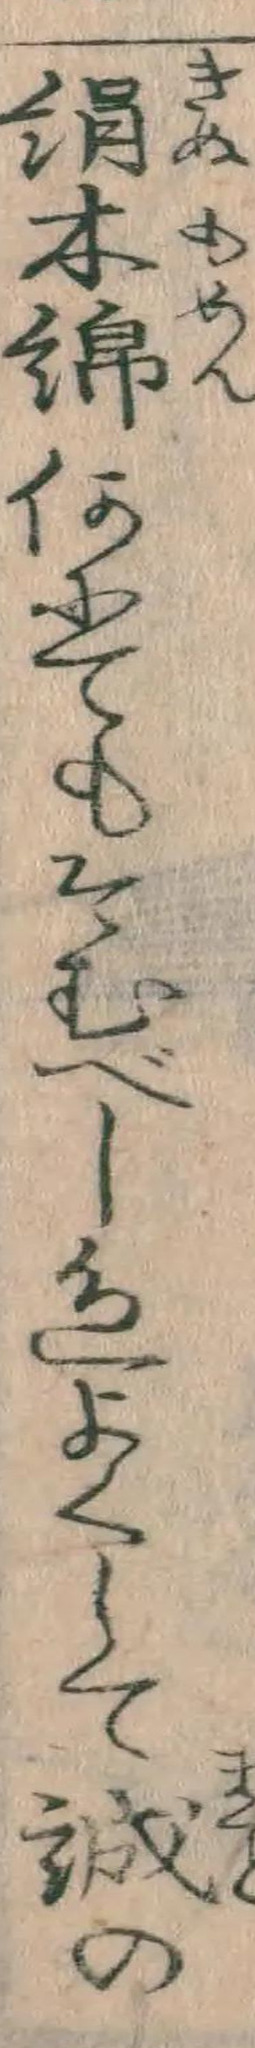絹木綿何にてもそむべし色よくして誠の
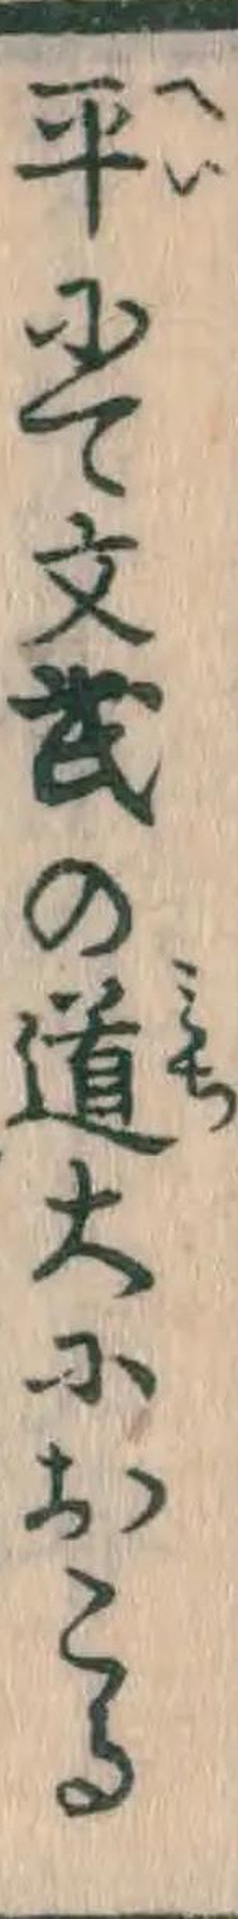平にて文武の道大におこる
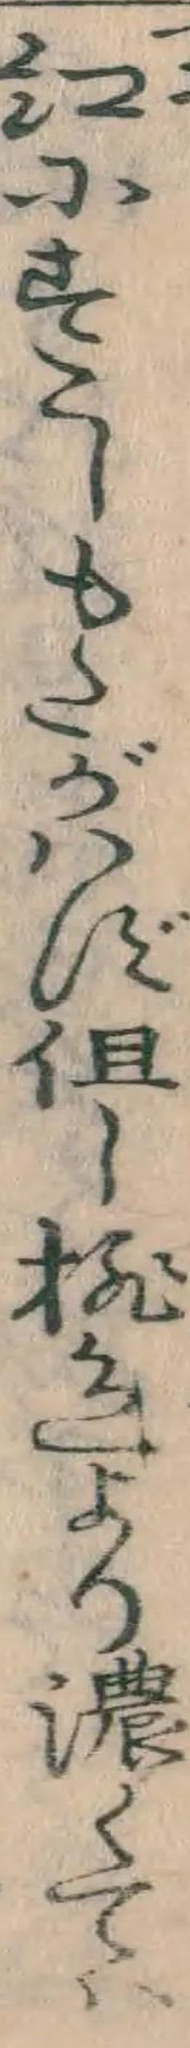紅にすこしもたがはず但し桃色より濃くては
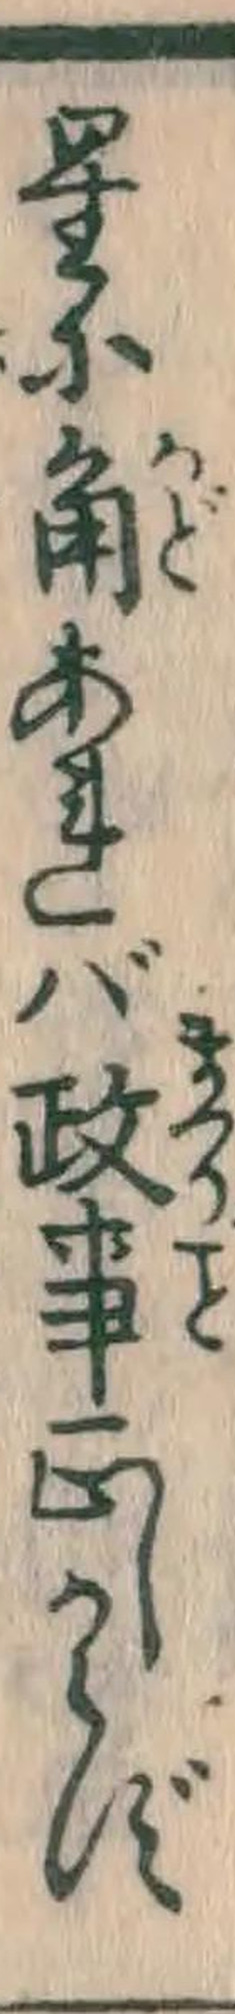星に角あれば政事正しからず
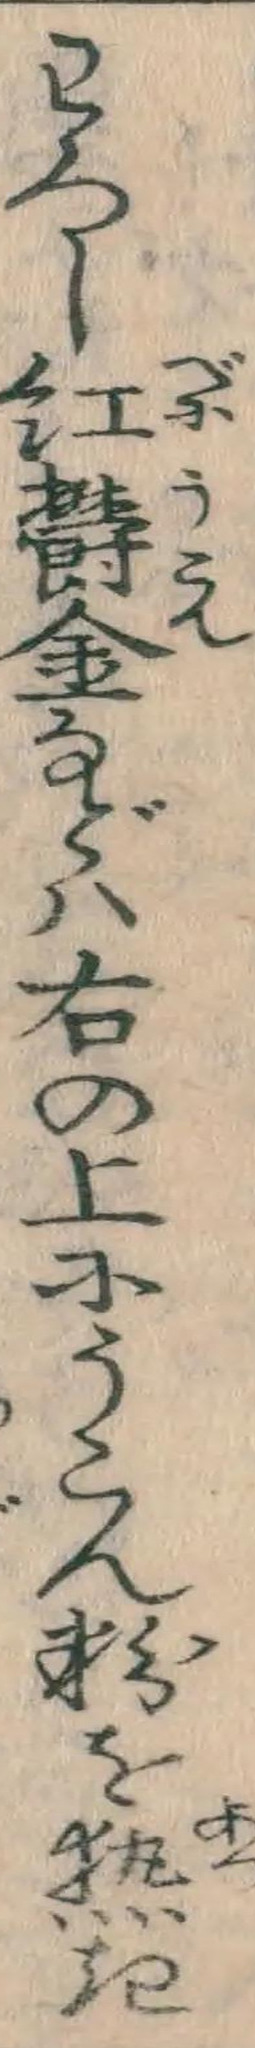わろし紅欝金などは右の上にうこん粉を熱き
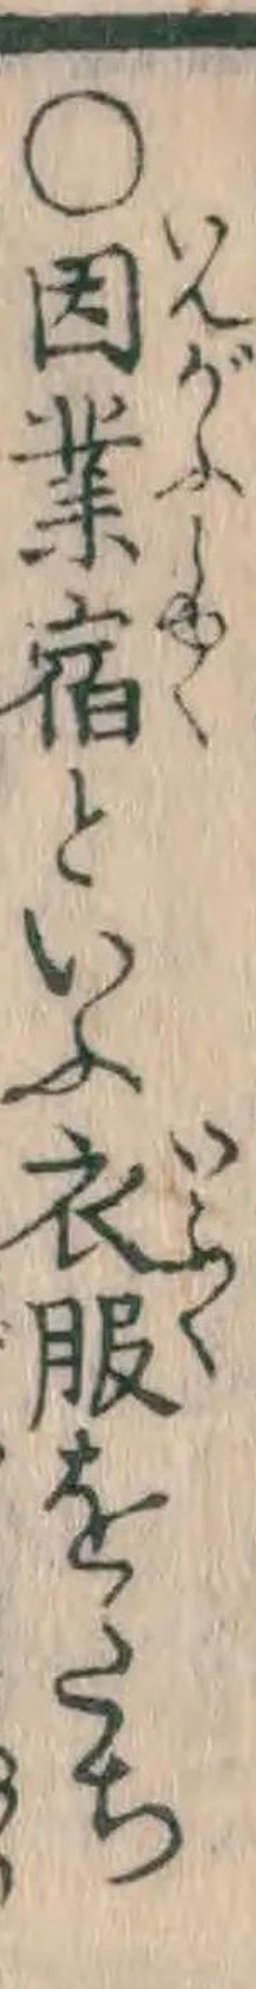○因業宿といふ衣服をたち
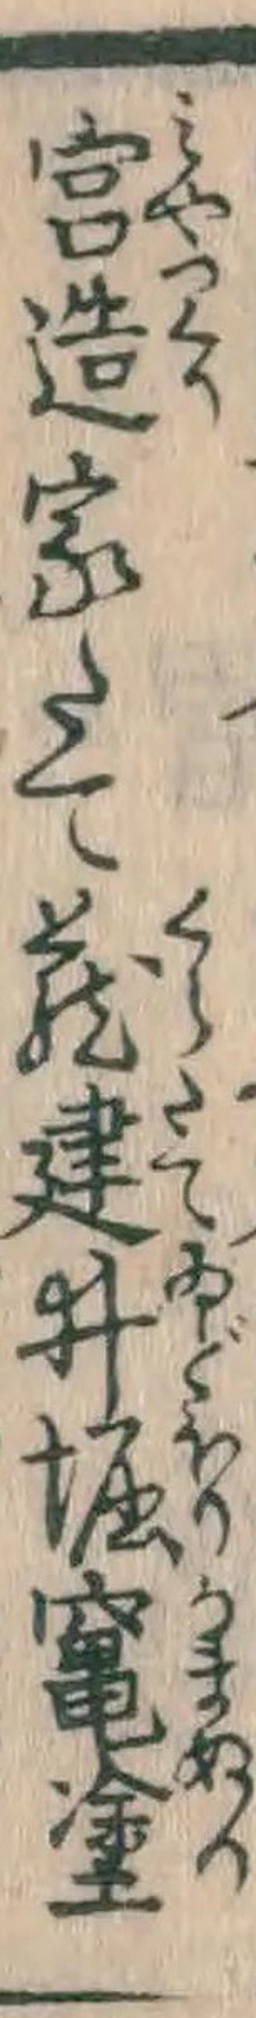宮造家たて蔵建井掘竈塗
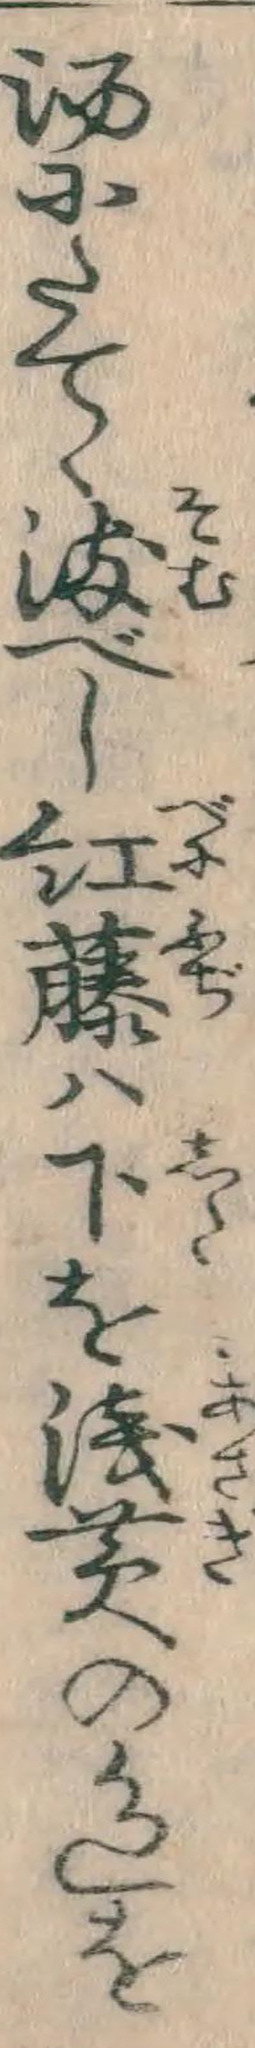湯にたてゝ染べし紅藤は下を浅黄の色を
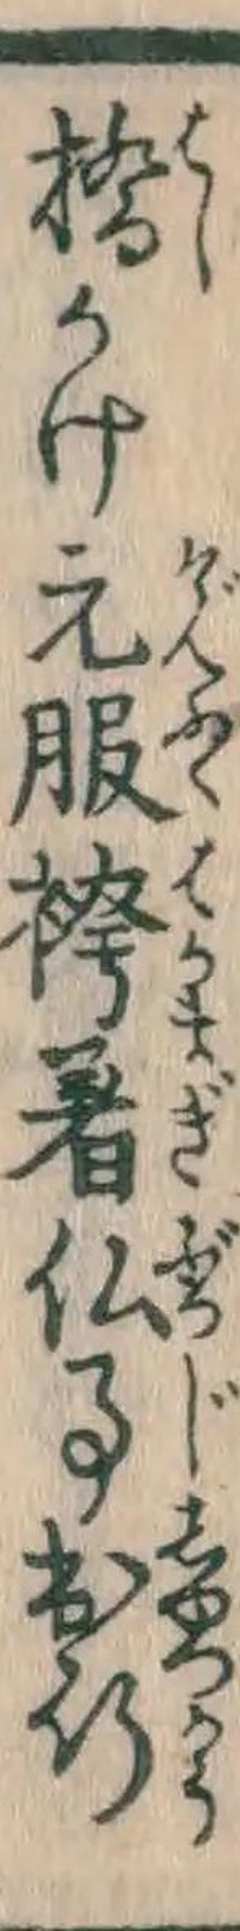橋かけ元服袴着仏事出行
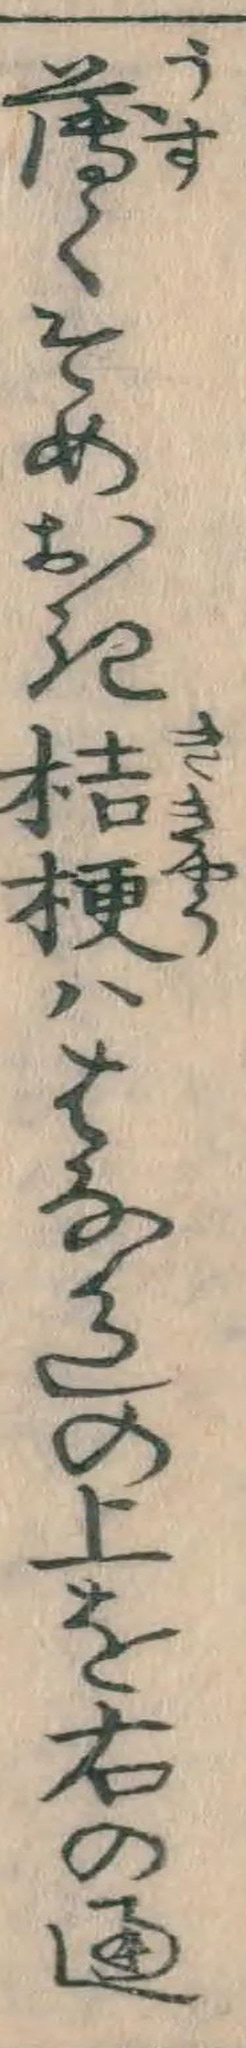薄くそめおき桔梗ははな色の上を右の通
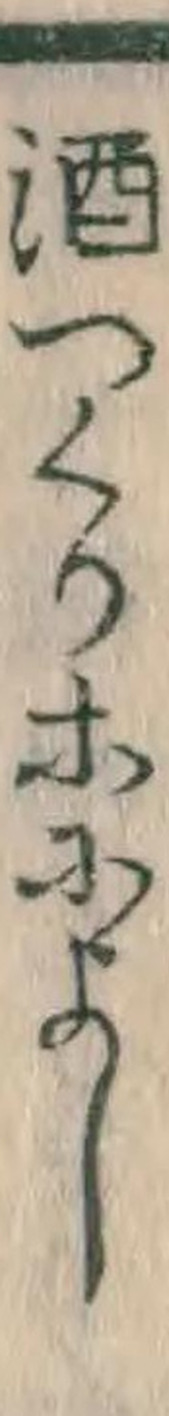酒つくり等によし
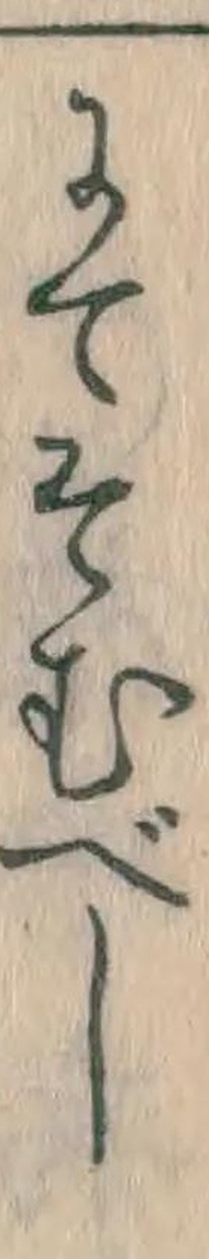にてそむべし
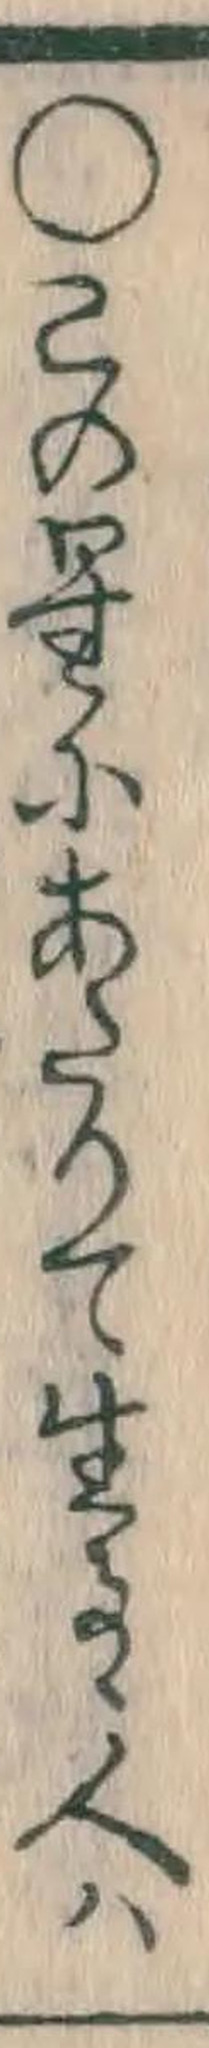○この星にあたりて生るゝ人は
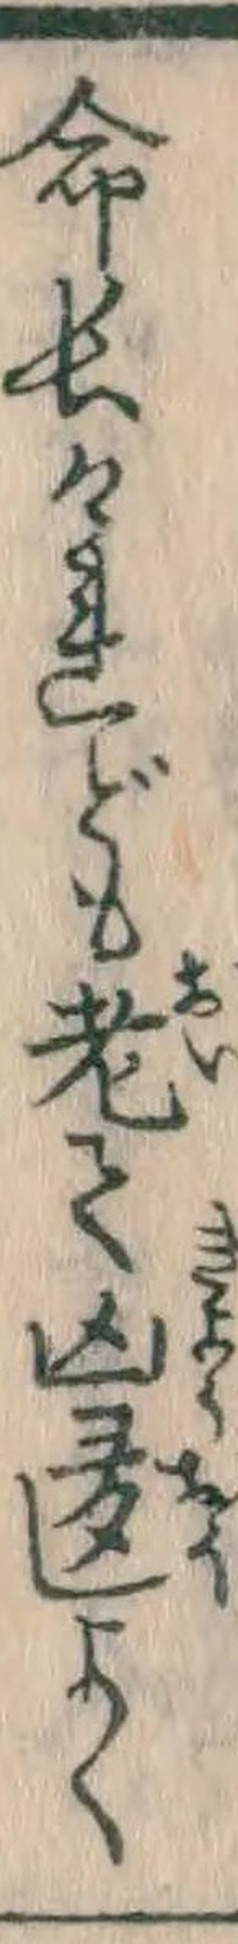命長けれども老て凶多しよく
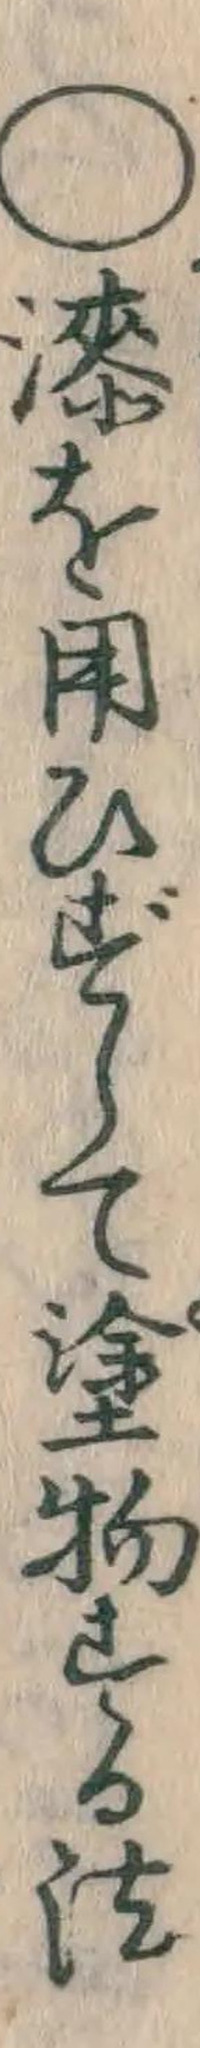○漆を用ひずして塗物する法
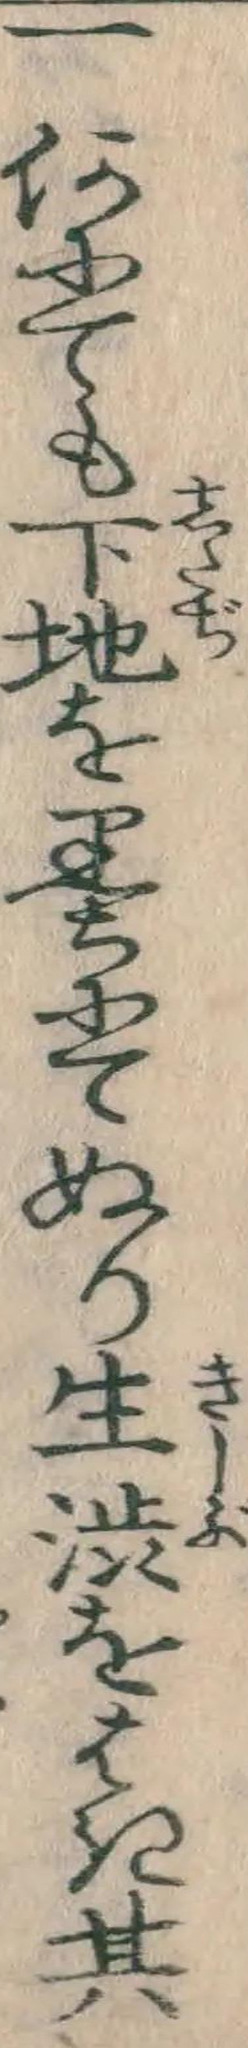一何にても下地を墨にてぬり生渋をはき其
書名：広益秘事大全 3巻. [2]
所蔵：国立国会図書館 National Diet Library, JAPAN
